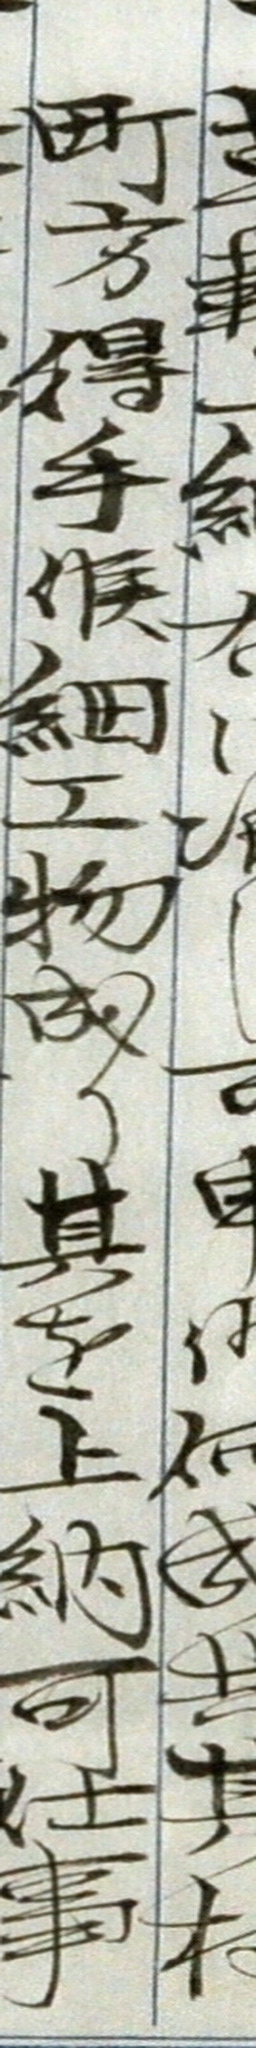町方得手候細工物成り其を上納可仕事
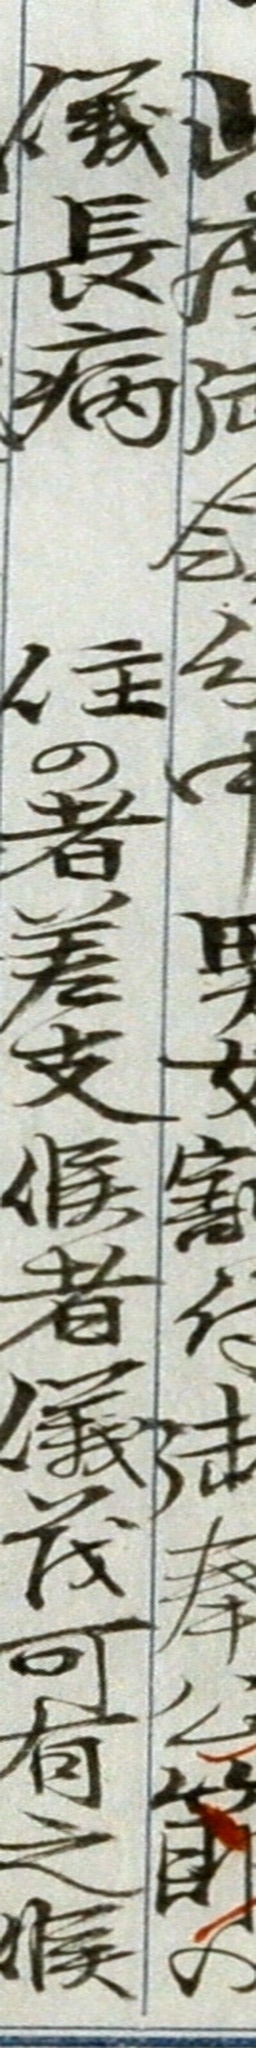儀長病住の者差支候者儀茂可有之候
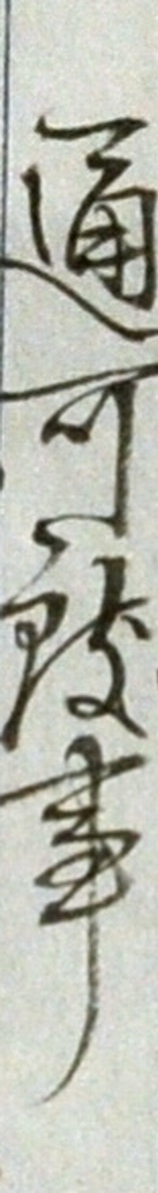通可致事
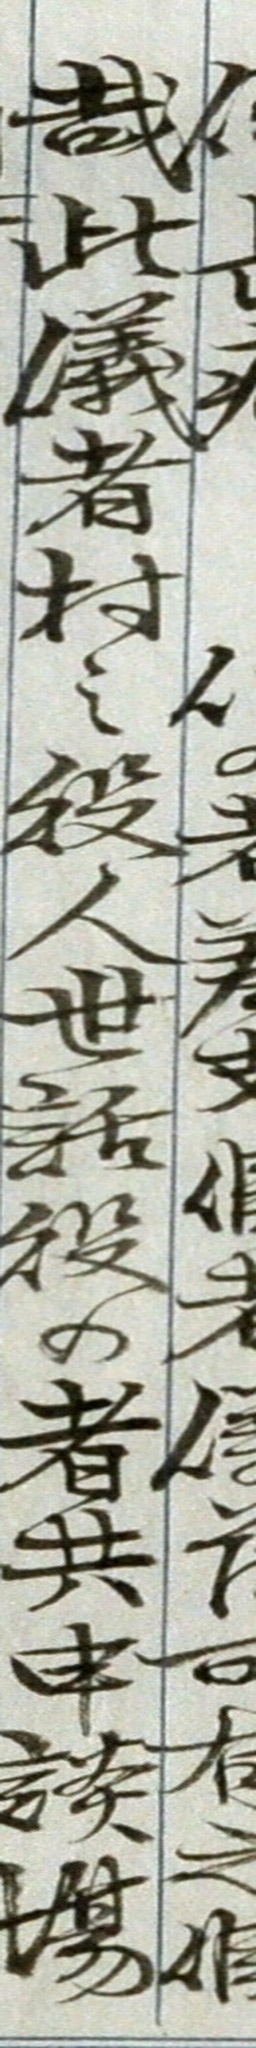哉此儀は村之役人世話役の者共申談場
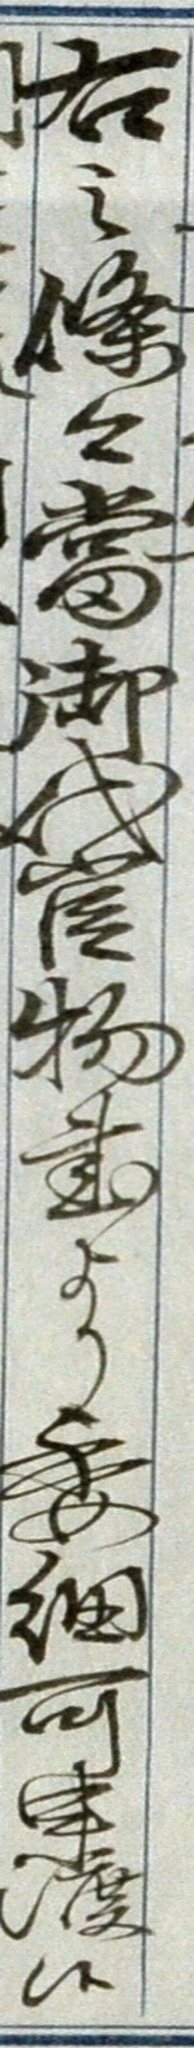右之条々当御代官物書より委細可申渡候
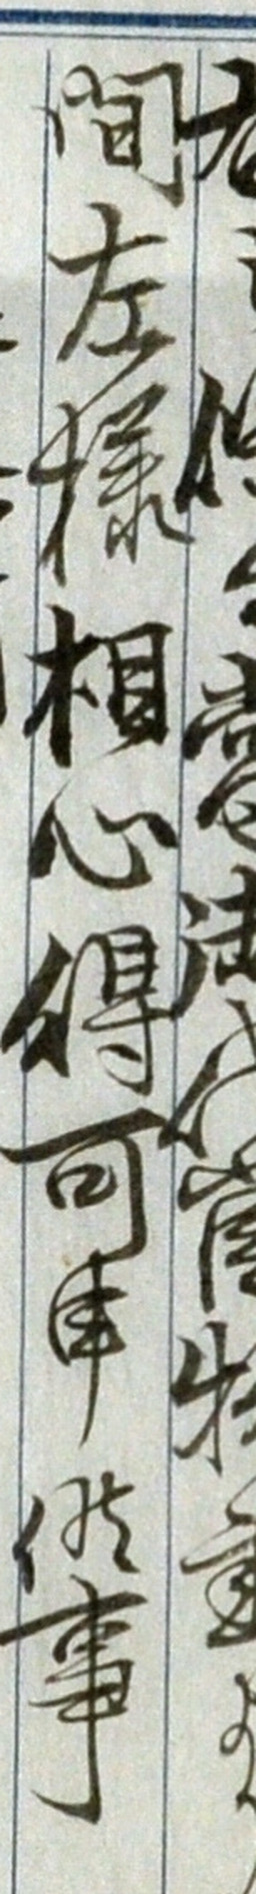間左様相心得可申候事
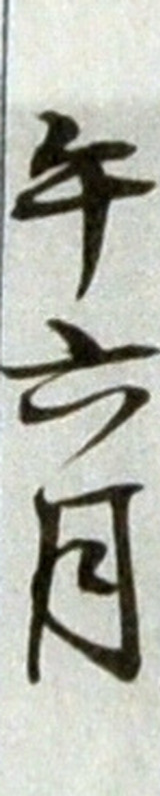午六月
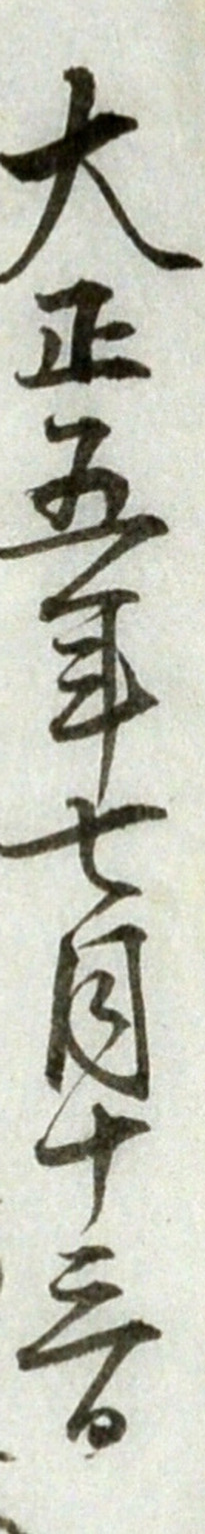大正五年七月十三日
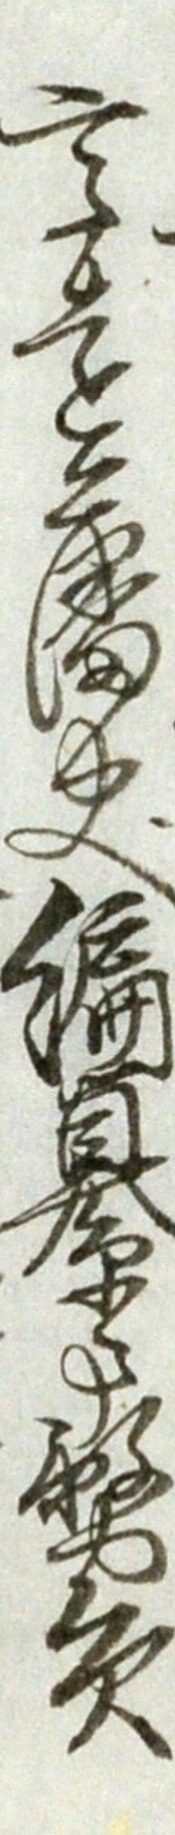高遠藩史編纂事務員
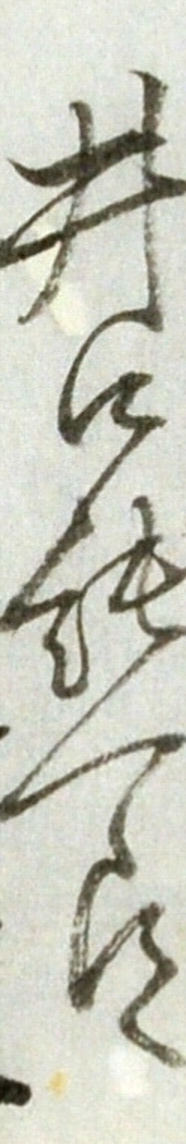井口純一郎
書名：倹約筋御沙汰書
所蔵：伊那市立高遠町図書館・合同会社AMANE
